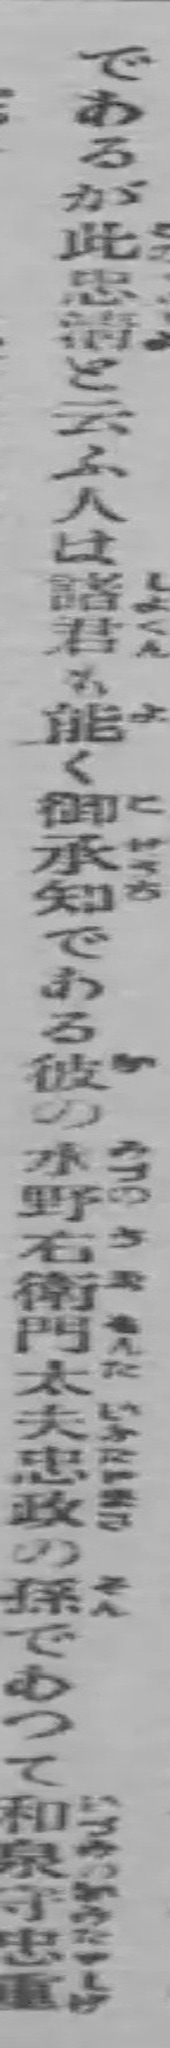水野忠政であるが此忠清と云ふ人は諸君も能く御承知である彼の水野右衛門太夫忠政の孫であつて和泉守忠重
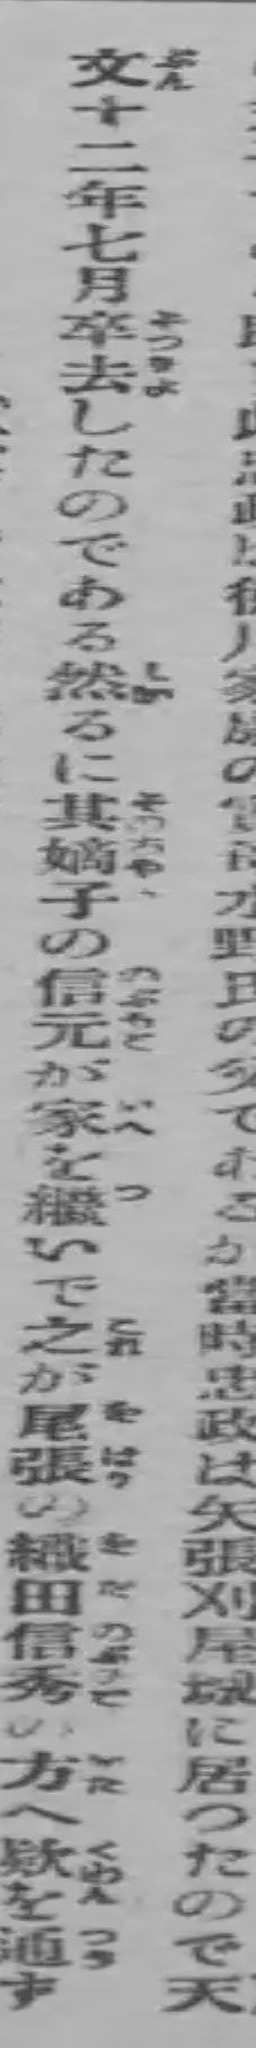文十二年七月卒去したのである然るに其嫡子の信元が家を継いで之が尾張の織田信秀の方へ欵を通ず
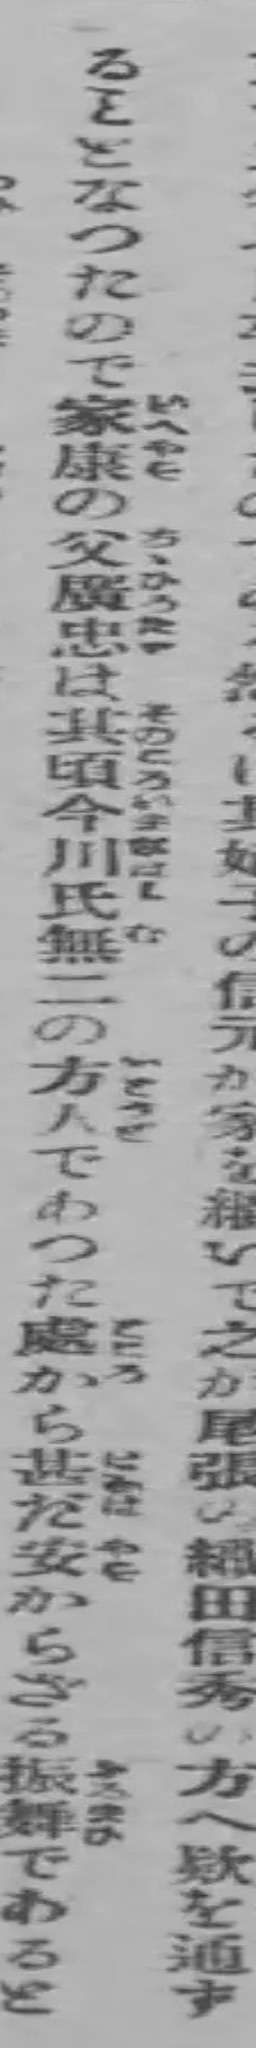ることとなつたので家康の父広忠は其頃今川氏無二の方人であつた処から甚だ安からざる振舞であると
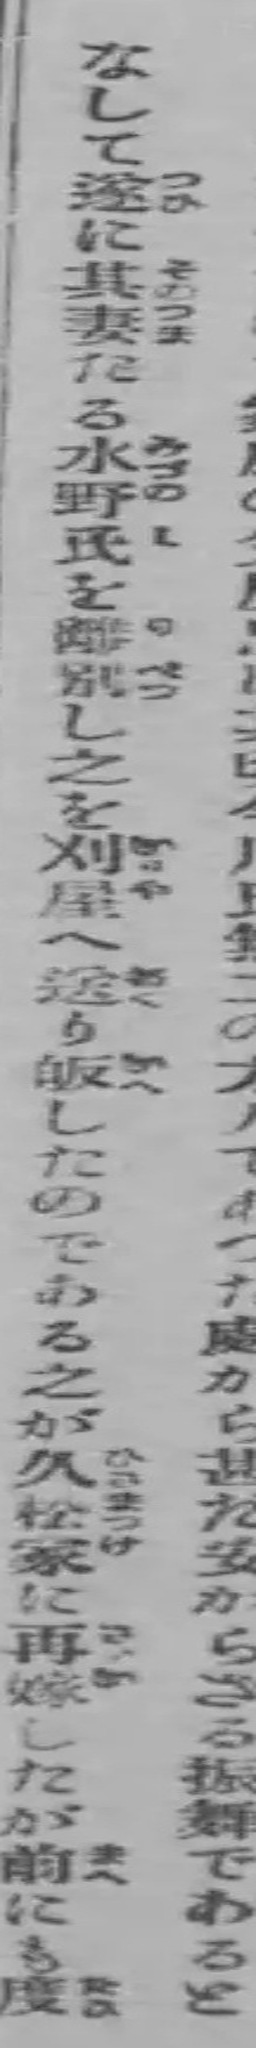なして遂に其妻たる水野氏を離別し之を刈屋へ送り皈したのである之が久松家に再嫁したが前にも度
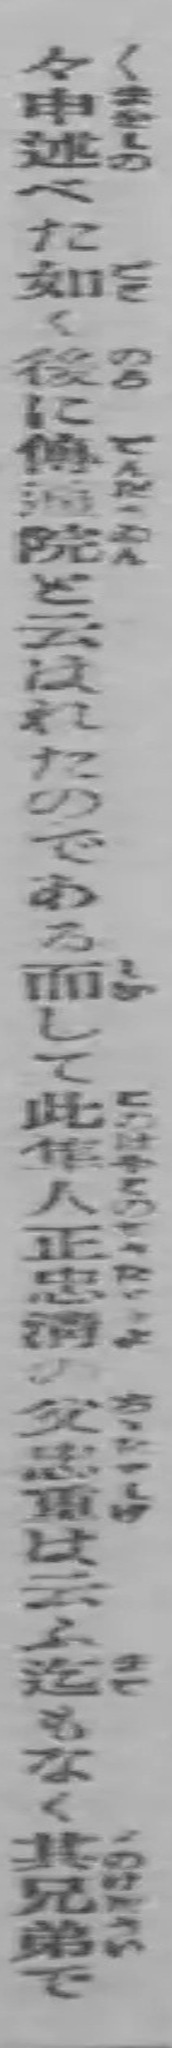水野忠重度申述べた如く後に伝通院と云はれたのである而して此隼人正忠清の父忠重は云ふ迄もなく其兄弟で
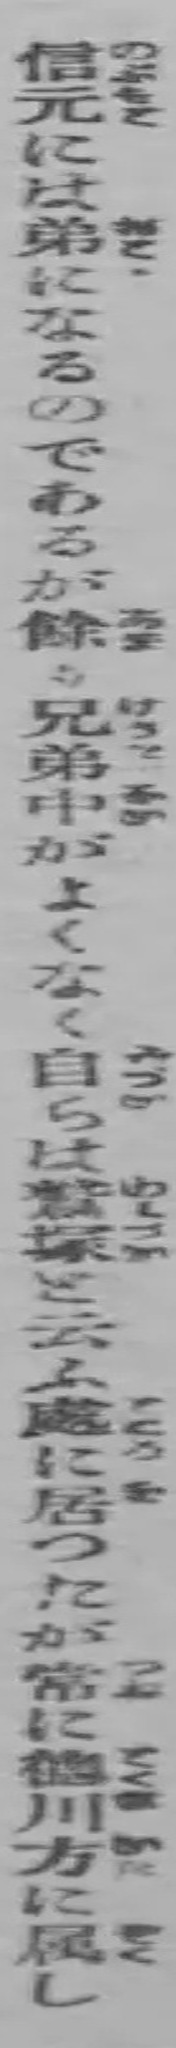信元には弟になるのであるが余り兄弟中がよくなく自らは鷲塚と云ふ処に居つたが常に徳川方に属し
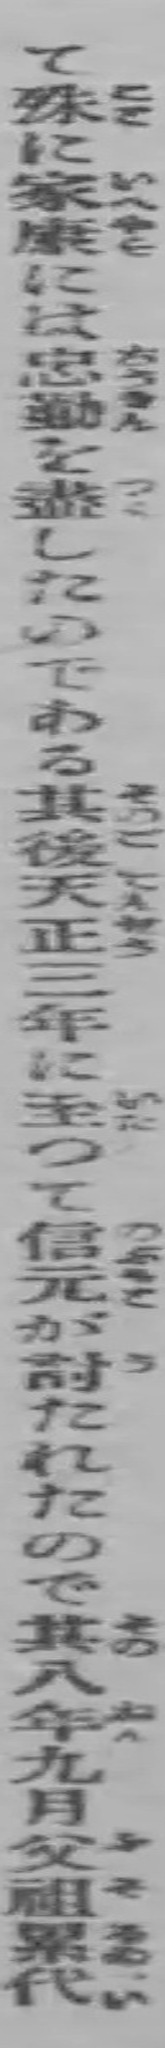て殊に家康には忠勤を尽したのである其後天正三年に至つて信元が討たれたので其八年九月父祖累代
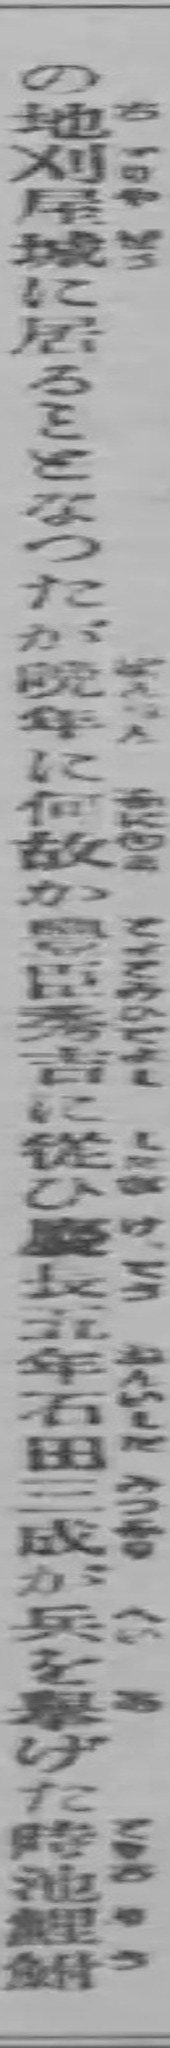の地刈屋城に居ることとなつたが晩年に何故か豊臣秀吉に従ひ慶長五年石田三成が兵を挙げた時池鯉鮒
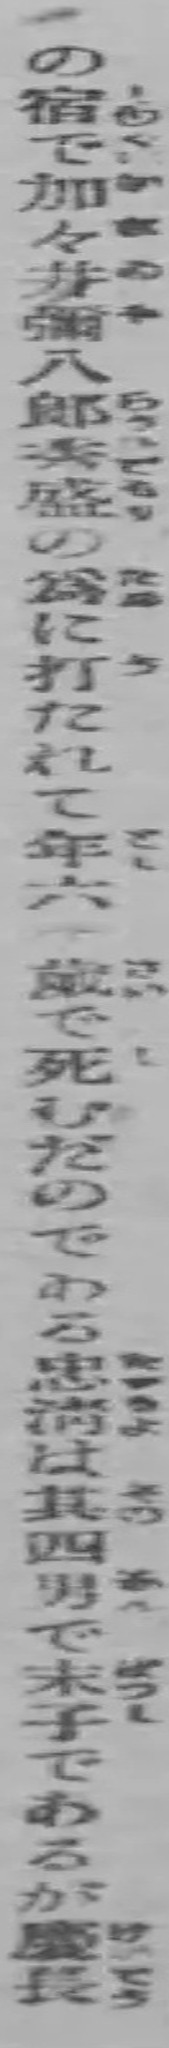の宿で加々井彌八郎秀盛の為に打たれて年六歳で死むだのである忠清は其四男で末子であるが慶長
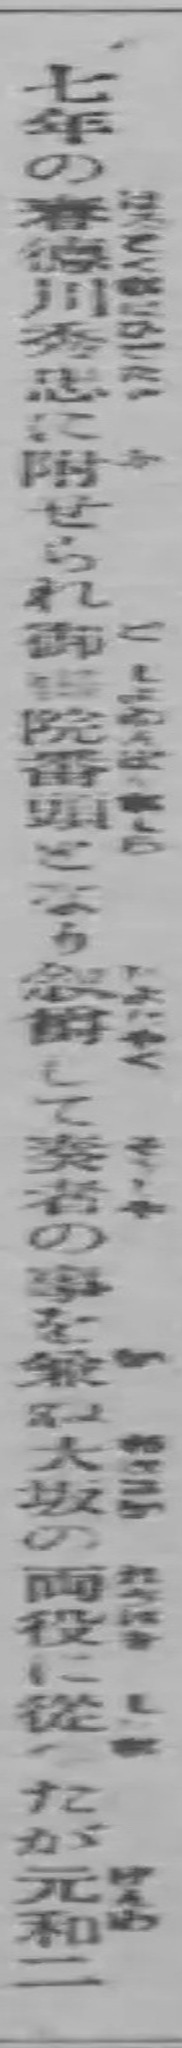七年の春徳川秀忠に附せられ御書院番頭となり叙爵して奏者の事を兼ね大坂の両役に従つたが元和二
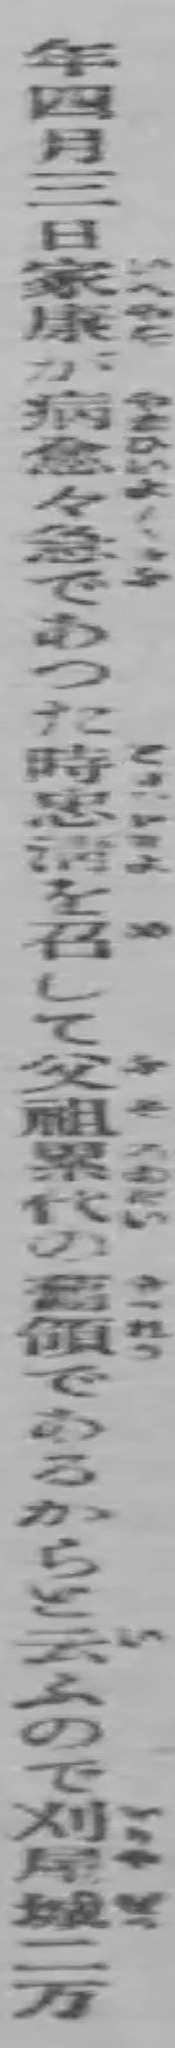年四月三日家康が病愈々急であつた時忠清を召して父祖累代の旧領であるからと云ふので刈屋城二万
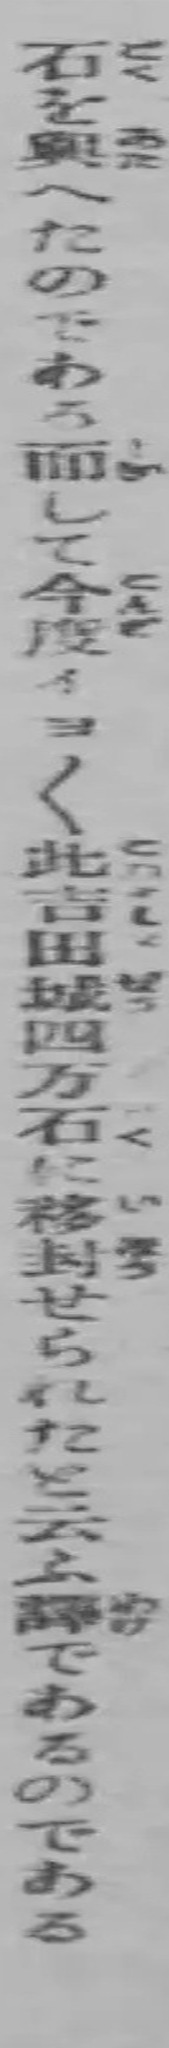石を与へたのである而して今度イヨ〳〵此吉田城四万石に移封せられたと云ふ訳であるのである
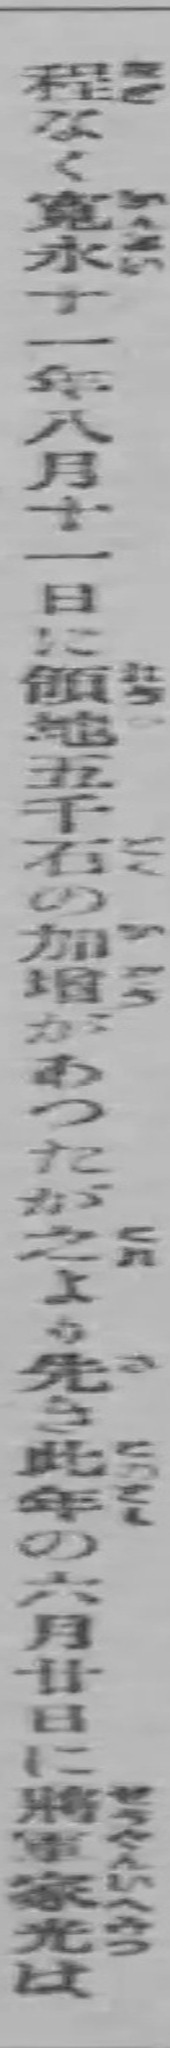忠清加増程なく寛永十一年八月十一日に領地五千石の加増があつたが之より先き此年の六月廿日に将軍家光は
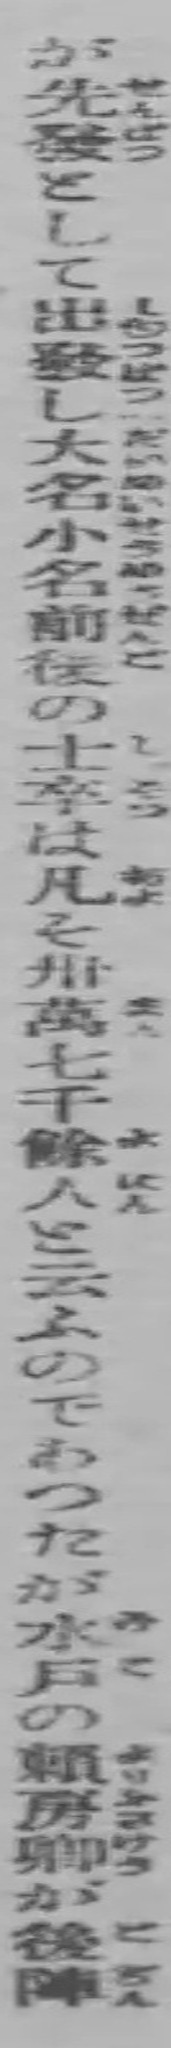が先発として出発し大名小名前後の士卒は凡そ卅万七千余人と云ふのであつたが水戸の頼房卿が後陣
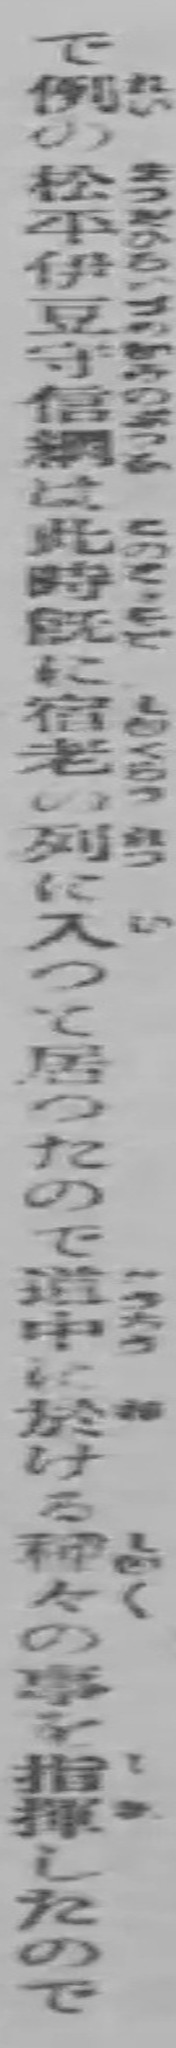で例の松平伊豆守信綱は此時既に宿老の列に入つて居つたので道中に於ける種々の事を指揮したので
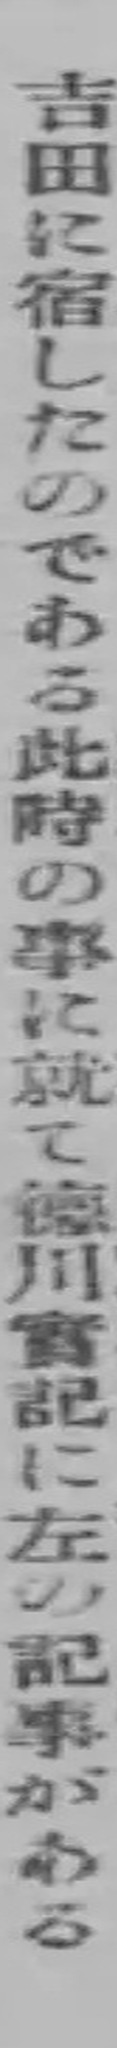吉田に宿泊したのである此時の事に就て徳川実記に左の記事がある
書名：豊橋市史談
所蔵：国立国会図書館 National Diet Library, JAPAN
